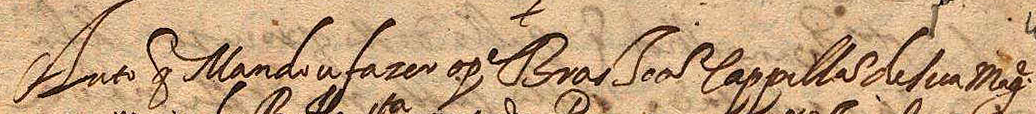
Auto q̄ Mandou fazer o pe Bras Joāo Cappellaõ de sua Mag.e
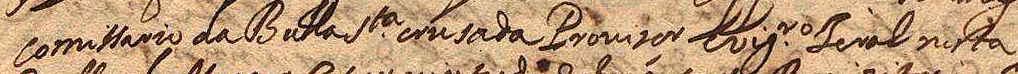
comissario da Bulla Sta. crusada Prouizor e vig.ro Jeral nesta
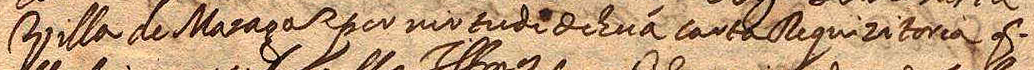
Villa de Mazagaõ e por uirtude de huā carta Requizitoria q̄
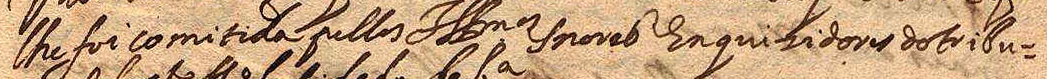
lhe foi comitida pellos Ill.mos Snores̄ Enquizidores do tribu
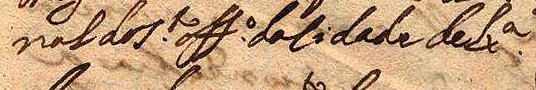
nal do s.to off.o da Cidade de Lxa.
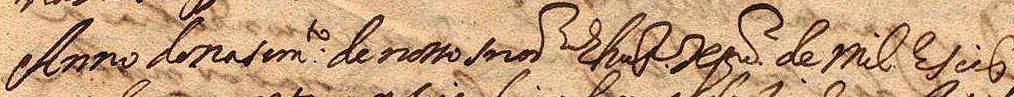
Anno do nasimto. de nosso snor̄ Ihus̄ xpō. de mil E seis
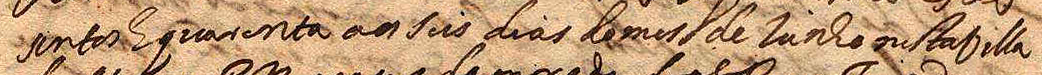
centos E quarenta aos seis dias do mes de Junho nesta Villa
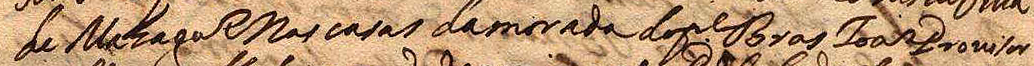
de Mazagaõ e Nas casas da morada do pe Bras Joaõ Prouisor
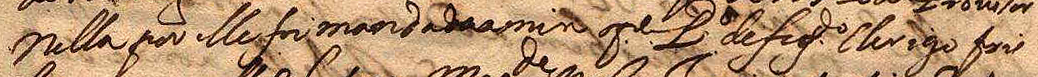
nella por elle foi mandado a min o pe Po de fig.do Clerigo pris
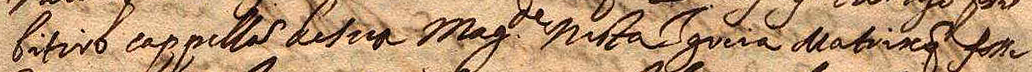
bitiro cappellaõ de sua mag.de nesta Igreia Matrix q̄ fosse
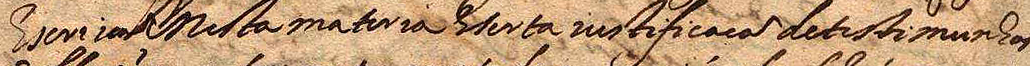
Escriuaõ nesta materia E serta iustificaçaõ de testimunhas
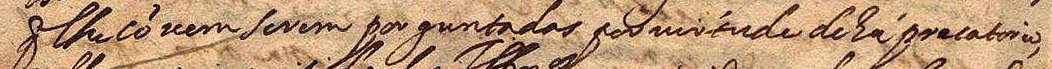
q̄ lhe cōuem serem perguntadas por uirtude de hū precatorio,
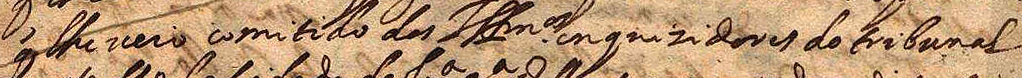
q̄ lhe ueio comitido dos Illmos inquizidores do tribunal
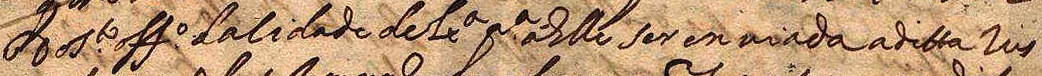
do s.to offo da Cidade de Lxa pa a Elle ser enuiada a ditta jus
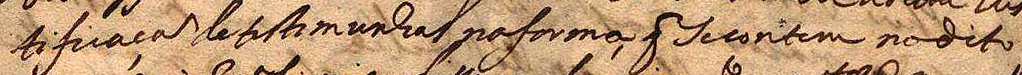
tificaçaõ de testemunhas na forma, q̄ se contem no dito
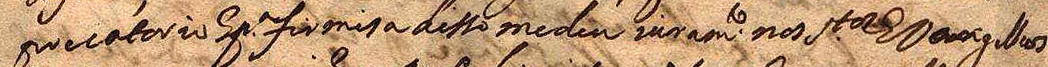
precatorio E pa firmisa desse me deu iuram.to nos s.tos Evangelhos
